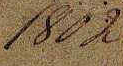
1802
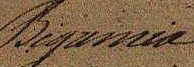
Bigamia
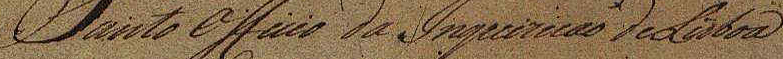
Santo Officio da Inquisicaõ de Lisboa
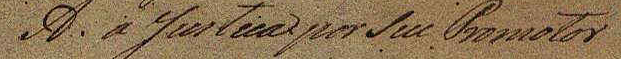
A. a Justica por seu Promotor
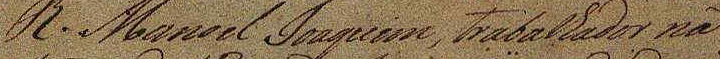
R. Manoel Ioaquim, trabalhador na
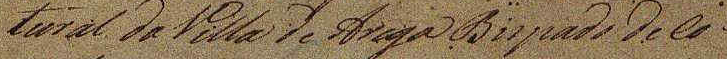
tural da Villa de Arega Bispado de Co
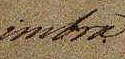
imbra
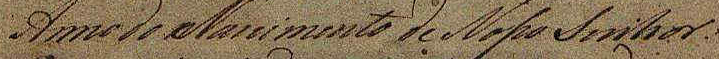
Anno do Nascimento de Nosso Senhor
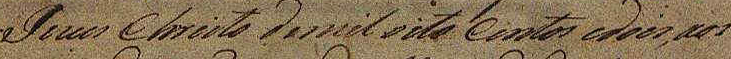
Iesus Christo de mil oito centos e dois, aos
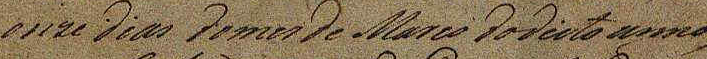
onze dias do mes de Marco do dicto anno,
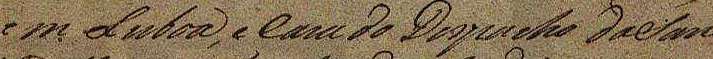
em Lisboa, e Casa do Despacho da San
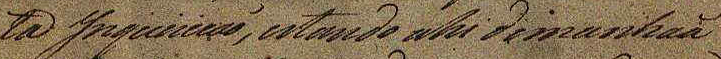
ta Jnquisicaõ, estando ahi de manhaã
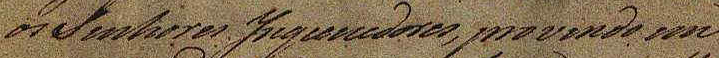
os Senhores Jnquisidores, provindo em
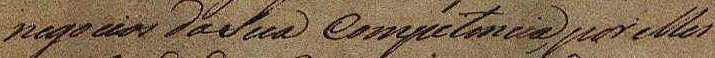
negocios da Sua competencia por elles
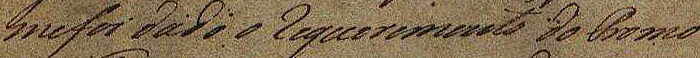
me foi dado o Requerimento do Promo
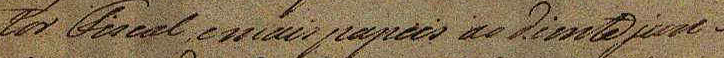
tor Fiscal, e mais papeis ao adiante jun
